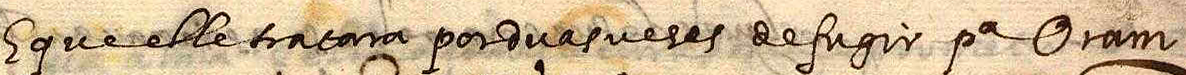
E que elle tratara por duas uezes de fugir pa Oram
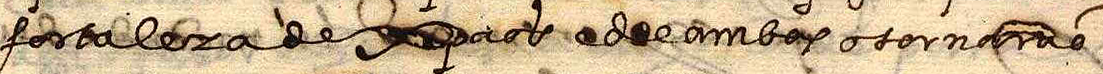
fortaleza de Xpaõs e de ambas o tornaraõ
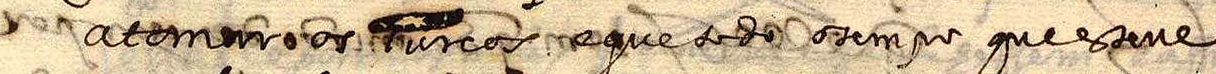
a tomar os turcos e que todo o tempo que esteue
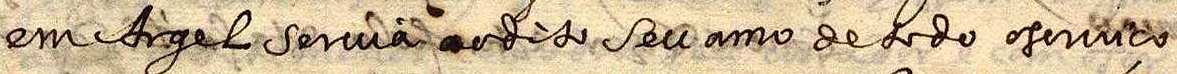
em Argel seruia ao dito seu amo de todo o seruiço
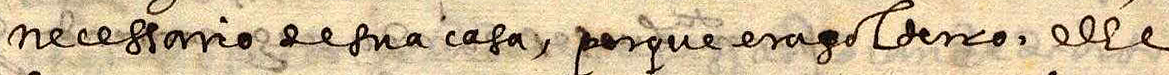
necessario de sua casa, porque era solteiro, e lhe
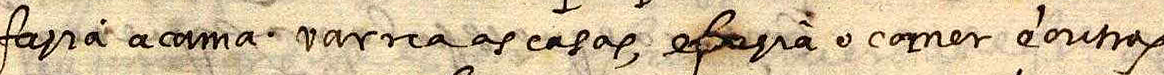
fazia a cama varria as casas, e fazia o comer e outras
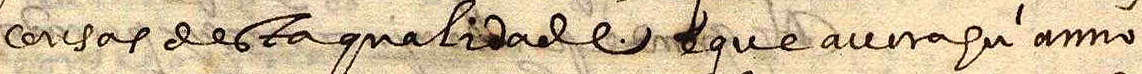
cousas desta qualidade e que auera hū anno
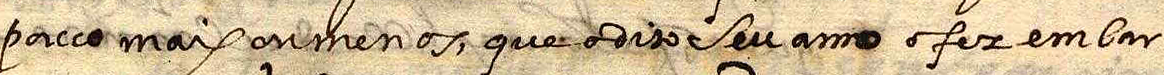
pouco mais ou menos, que o dito seu amo o fez embar
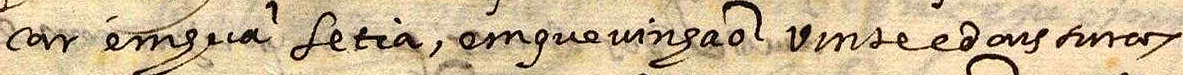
car em huā Setia, em que uinhaõ vinte e dous turcos
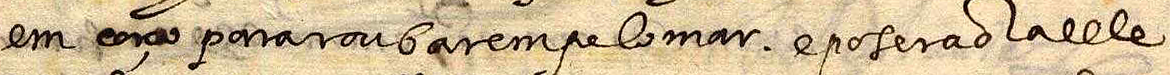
em corço para roubarem pelo mar. e poseraõ a elle
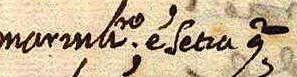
marinh.ro ē Setia q̄
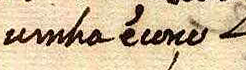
uinha ē corço
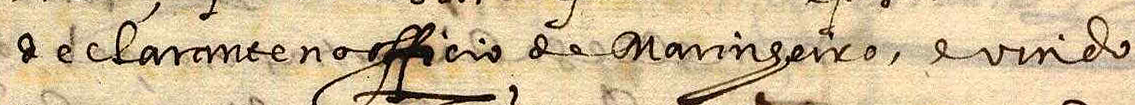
declarante no officio de Marinheiro, e vindo
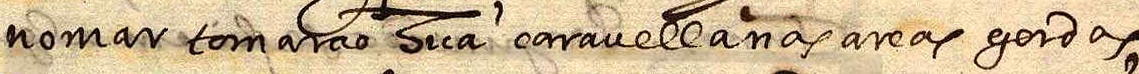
no mar tomarão huā carauella nas areas gordas,
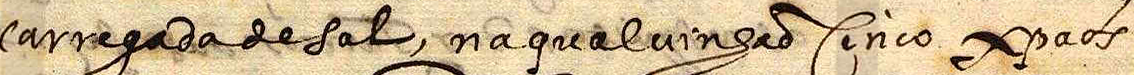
carregada de saL, na qual uinhaõ Cinco Xpaõs
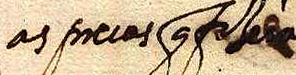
os presos q̄ fezerā
